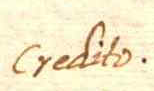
Credito.
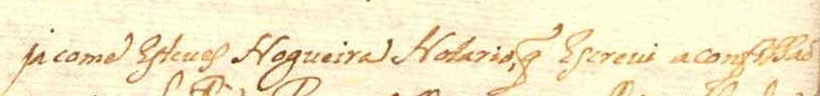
jacome Esteues Nogueira Notario, q̄ Escreui a confissaõ
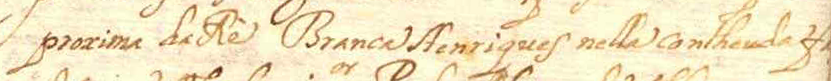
proxima da Re Branca Henriques nella contheudo f
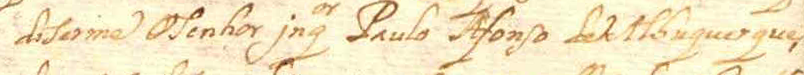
diserme O Senhor jnqor Paulo Afonso de Albuquerque
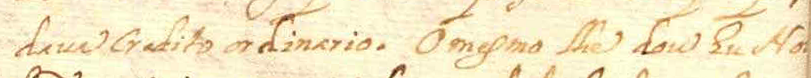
daua credito ordinario. O mesmo lhe dou Eu No
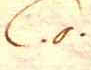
C. o.
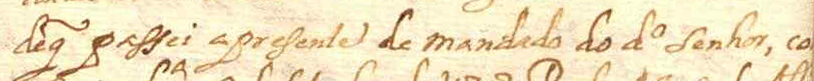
de q̄ passei a presente de mandado do do Senhor, co
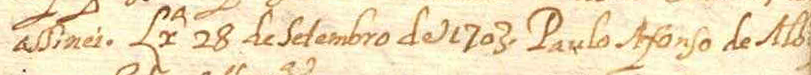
assinei. Lxa 28 de Setembro de 1703. Paulo Afonso de Alb
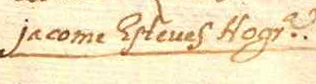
jacome Esteues Nogr.a.
